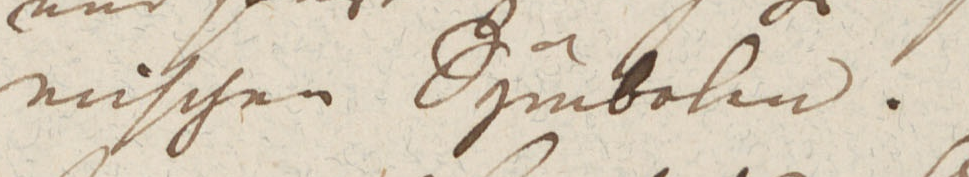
mischen Symbolen. – .
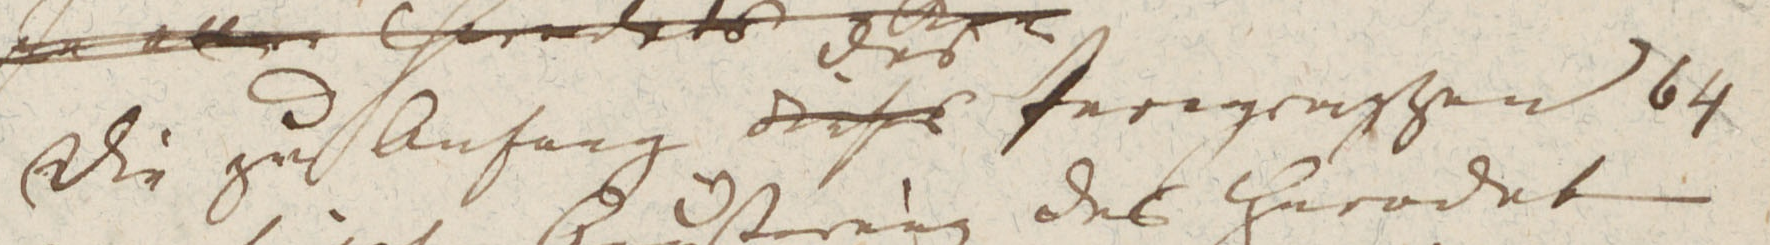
dDie zu Anfang dieses des Paragraphen 64
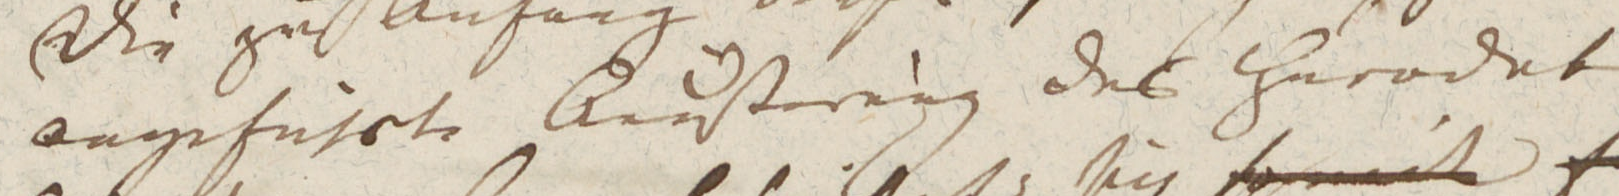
angeführte Aeusserung des Herodot
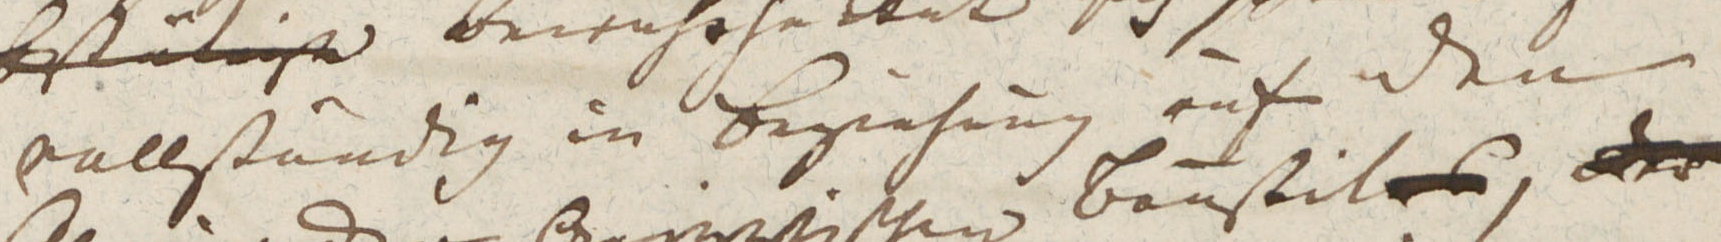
vollständig in Beziehung auf den
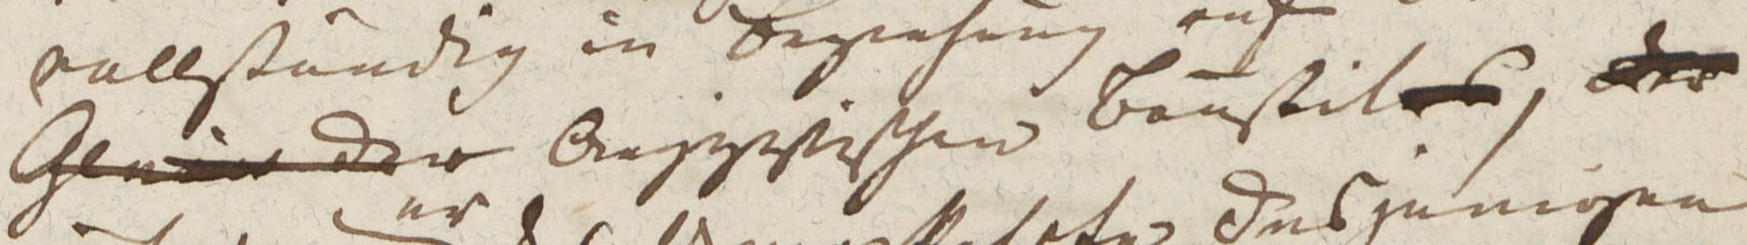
Gl der Aegyptischen Baustiles, der
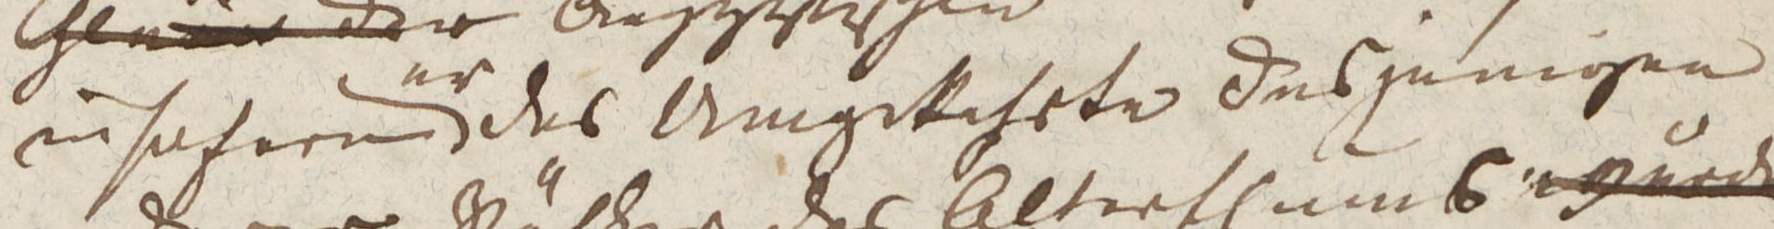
insofern er das Umgekehrte desjenigen
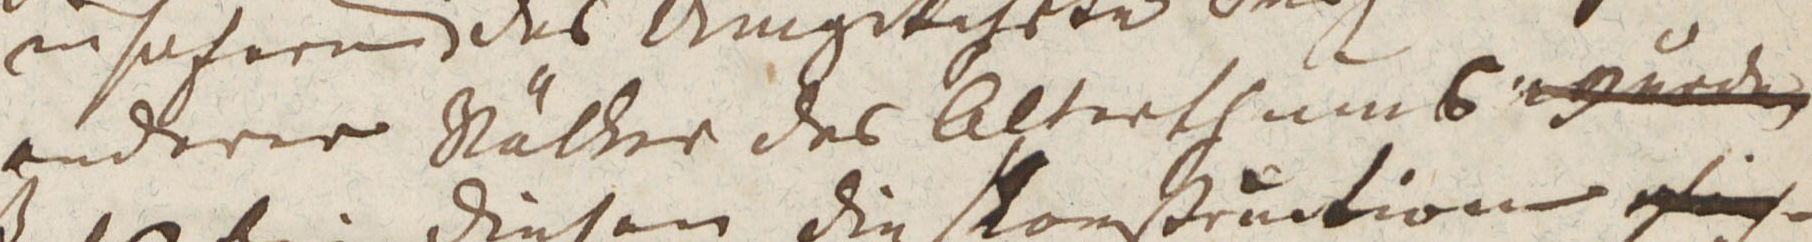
anderer Völker des Alterthums wurde,
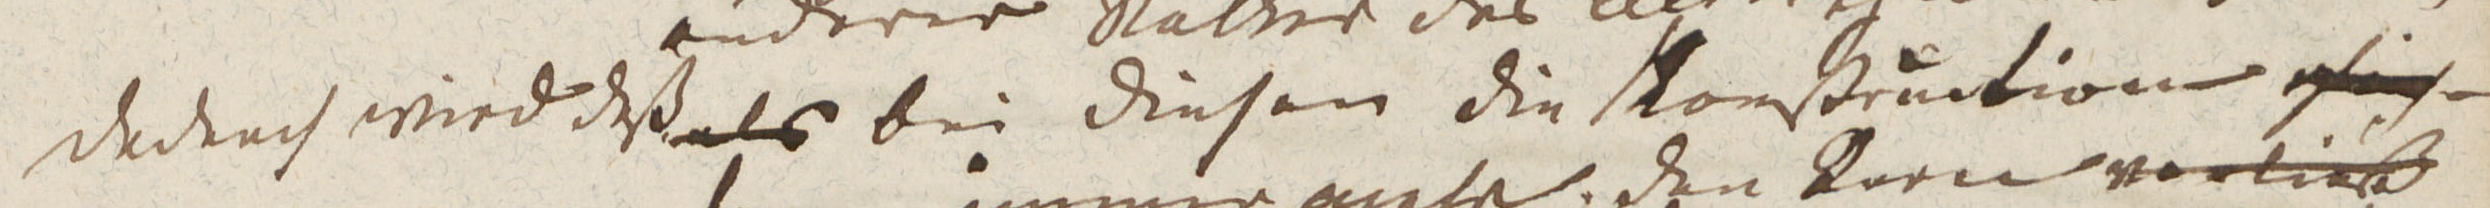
dadurch wird dass als bei diesen die kKonstruction gleich-
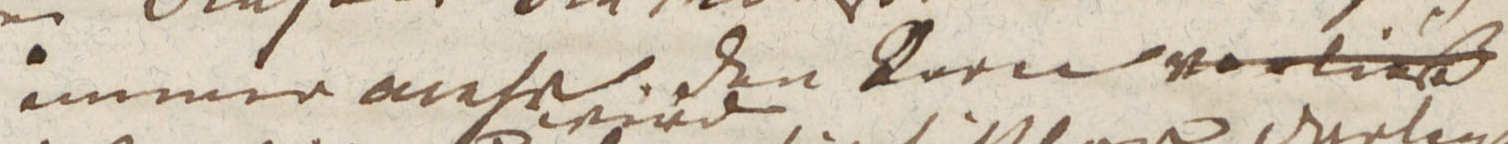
immer mehr den Kern verliess
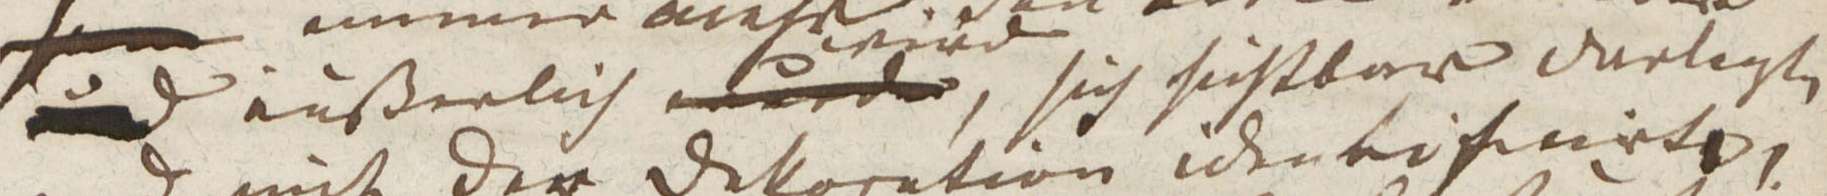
und äusserlich wurde wird, sich sichtbar darlegt
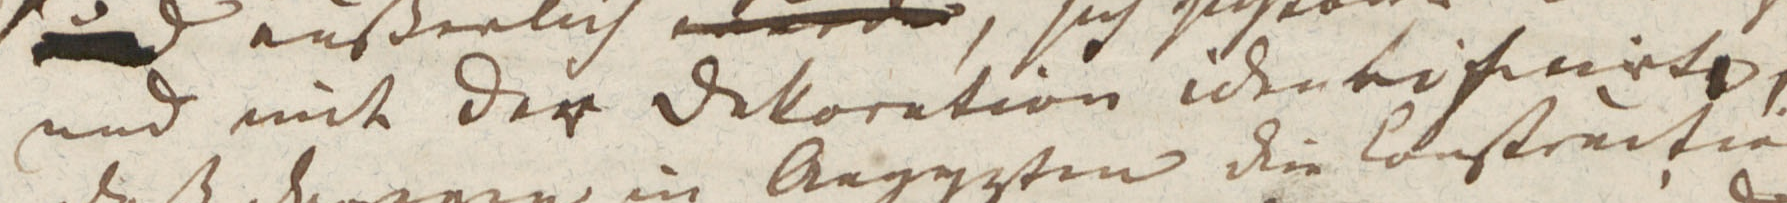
und mit denr Dekoration identificirte,
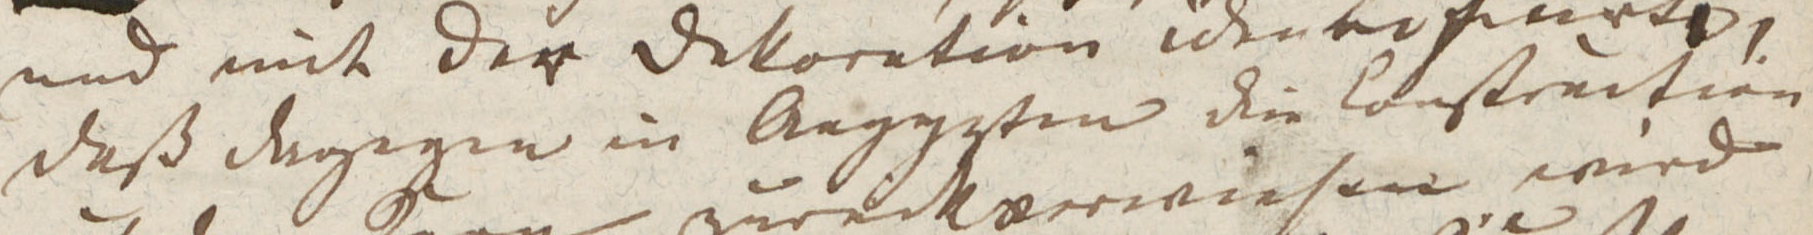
dass dagegen in Aegypten die Construction
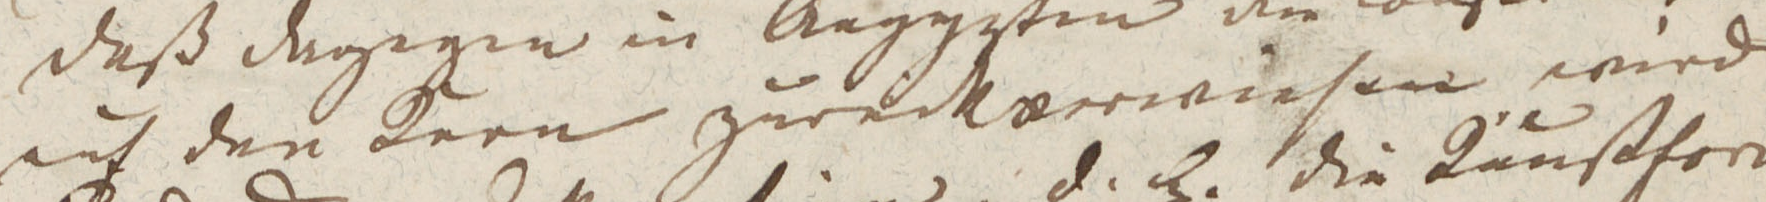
auf den Kern zurückverwiesen wird
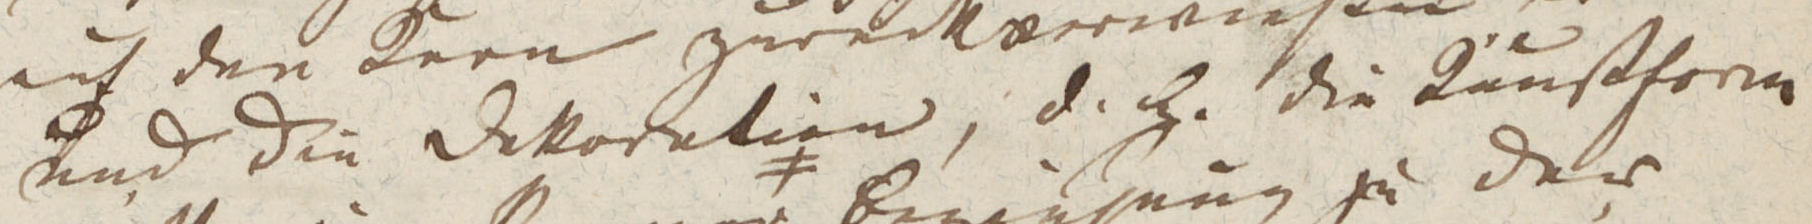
und die Dekoration, d. H. die Kunstform
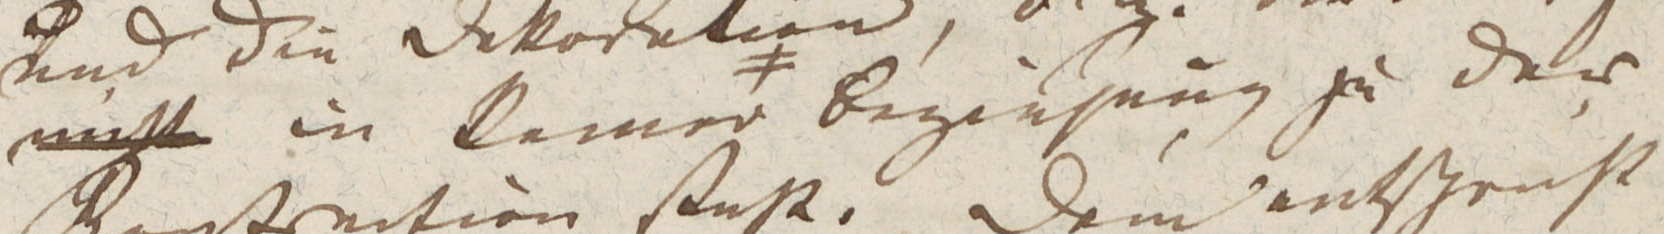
nicht in keiner % Beziehung zu der
